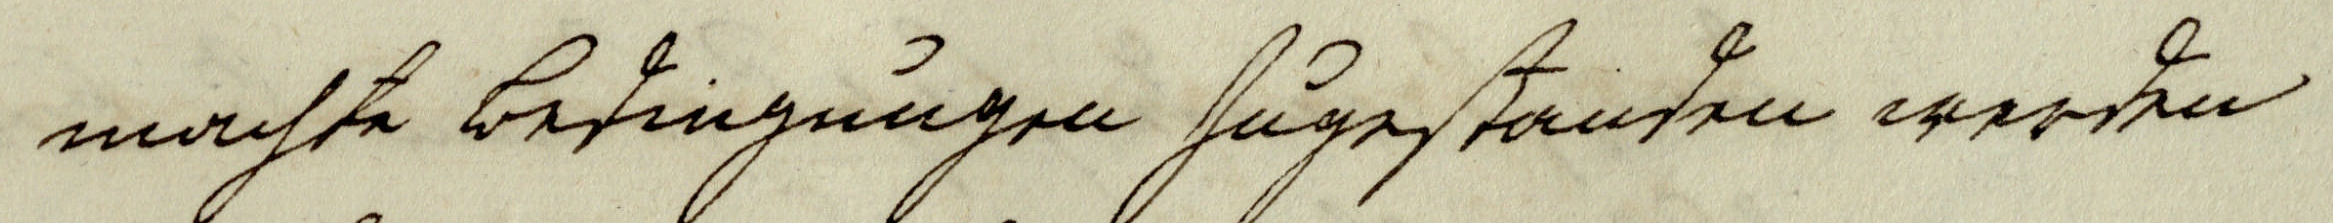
machte Bedingungen zugestanden werden
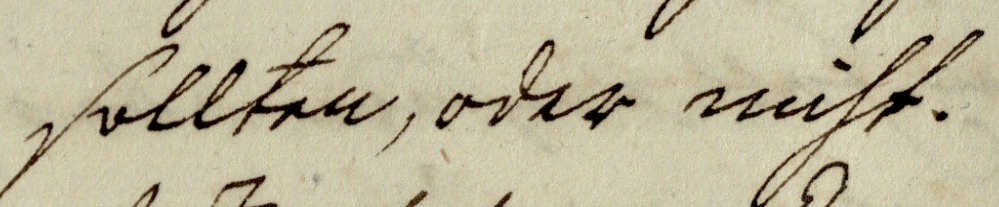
sollten, oder nicht.
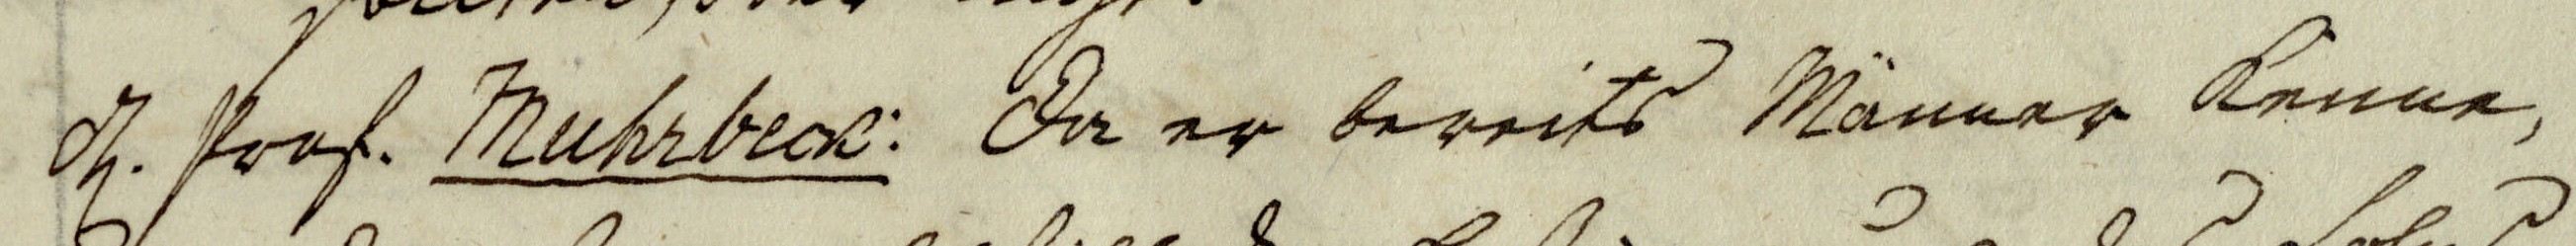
dh. Prof. Muhrbeck: Da er bereits Männer kenne,
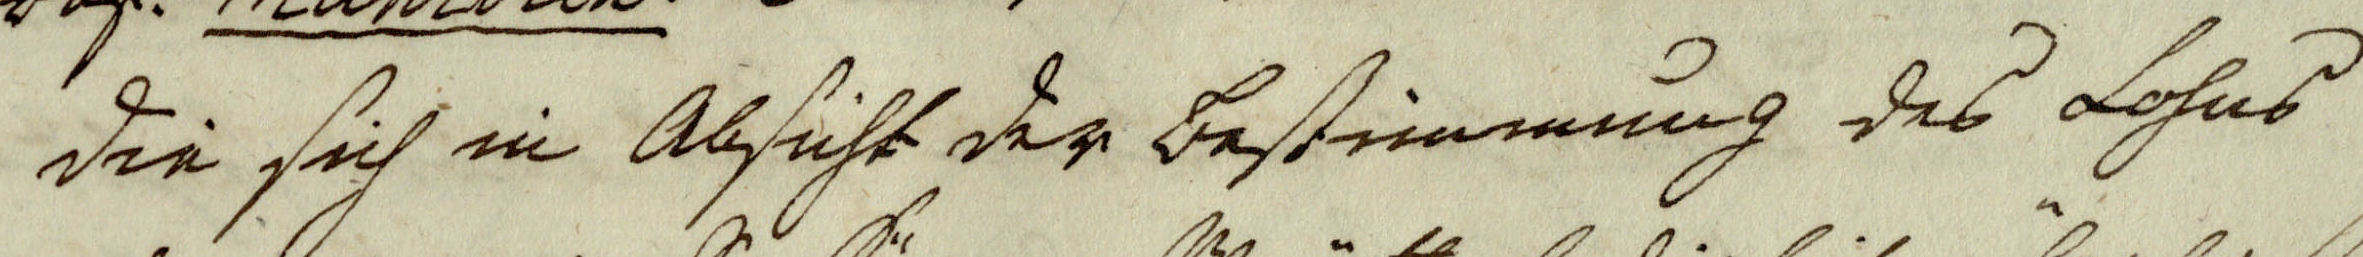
die sich in Absicht der Bestimmung des Lohns
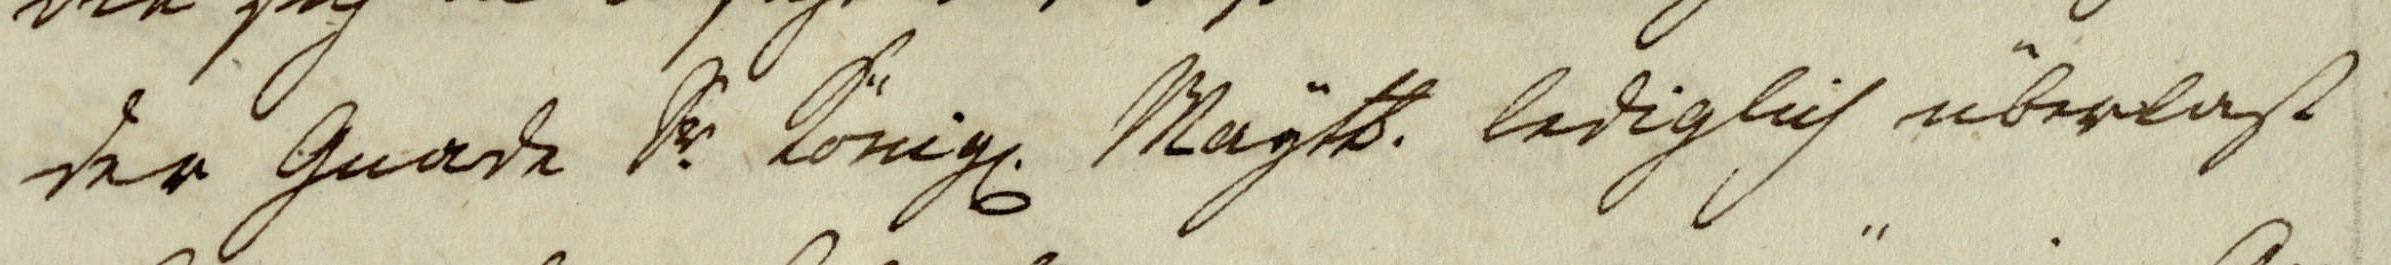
der Gnade Sr. Königl. Maÿst. lediglich überlas¬
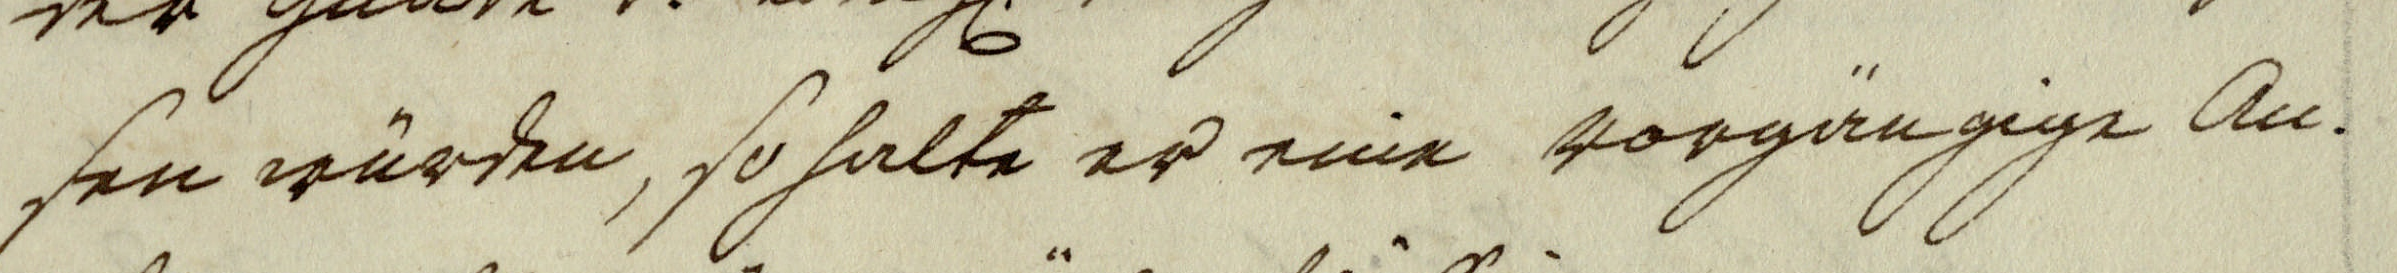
sen würden, so halte er eine vorgängige An¬
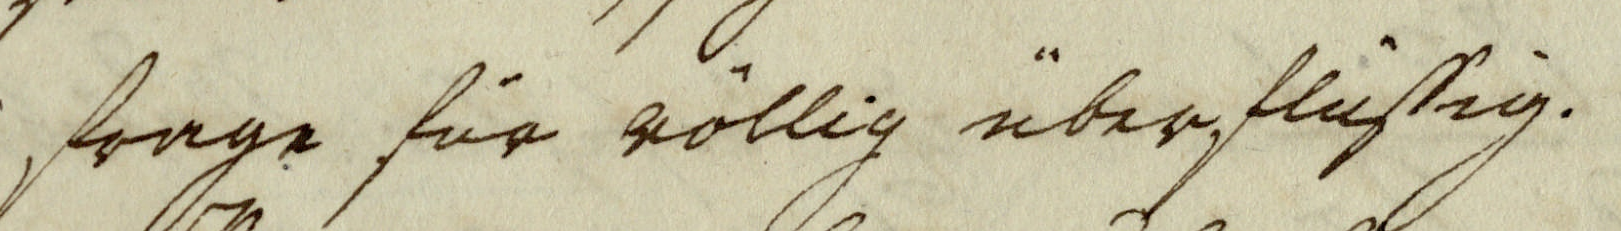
frage für völlig überflüssig.
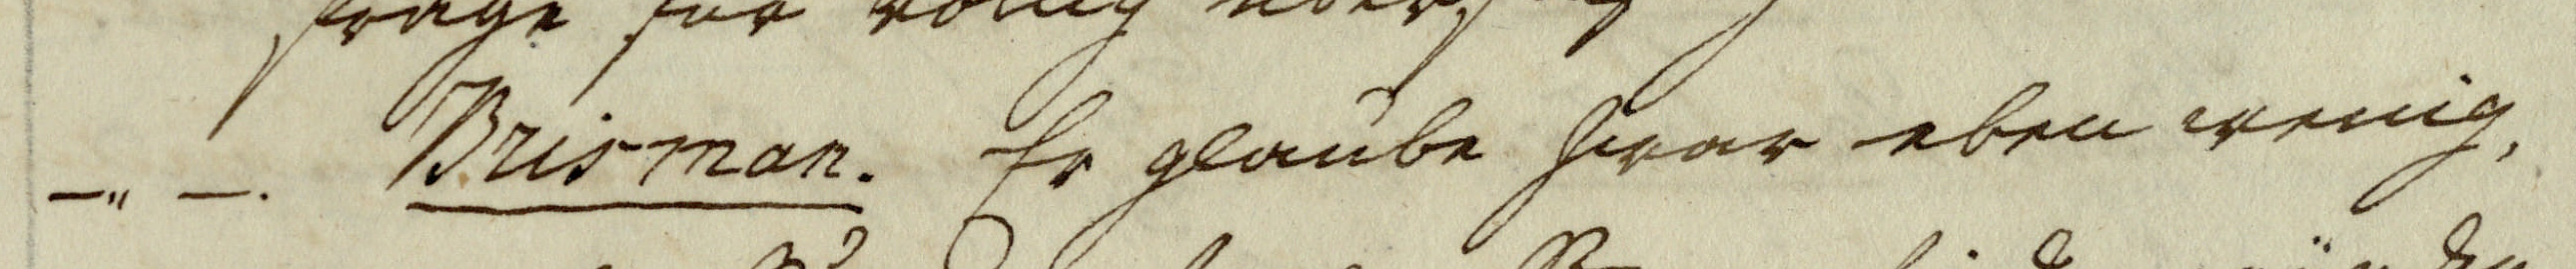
— " — . Brismann. Er glaube zwar eben wenig,
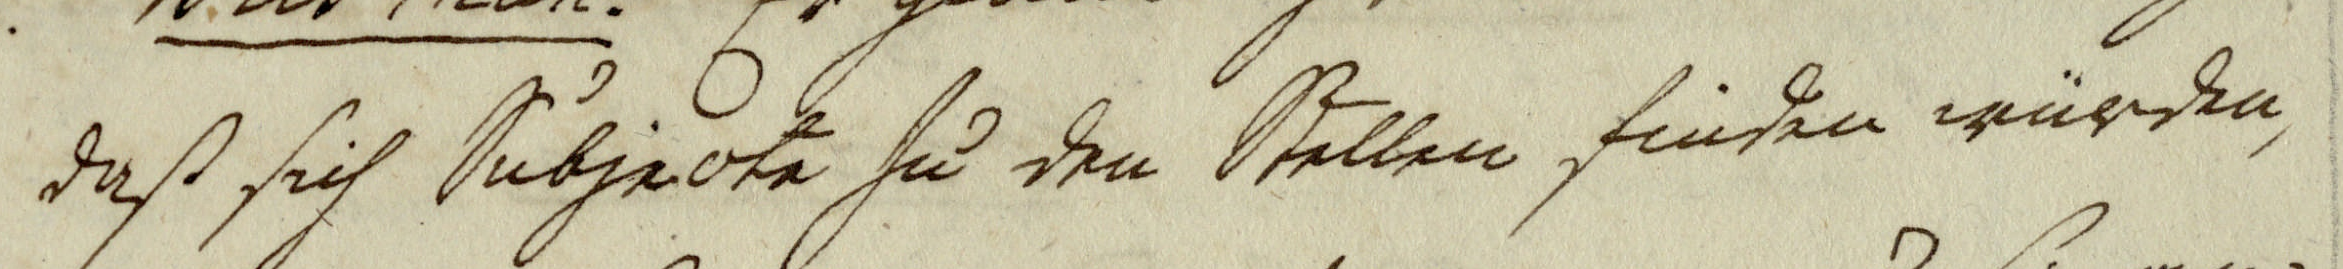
daß sich Subjecte zu den Stellen finden würden,
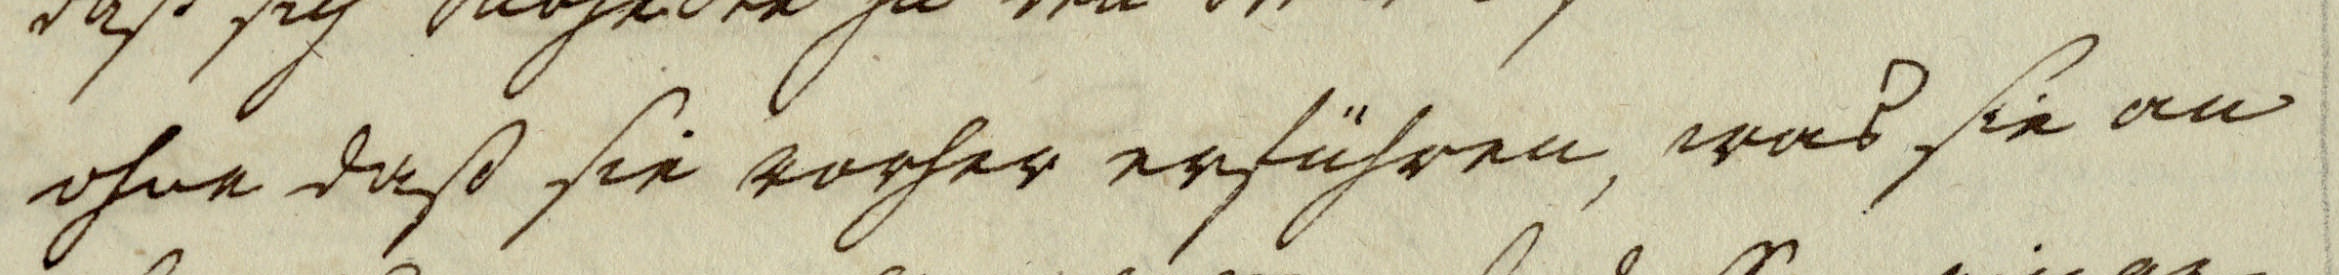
ohne daß sie vorher erführen, was sie an
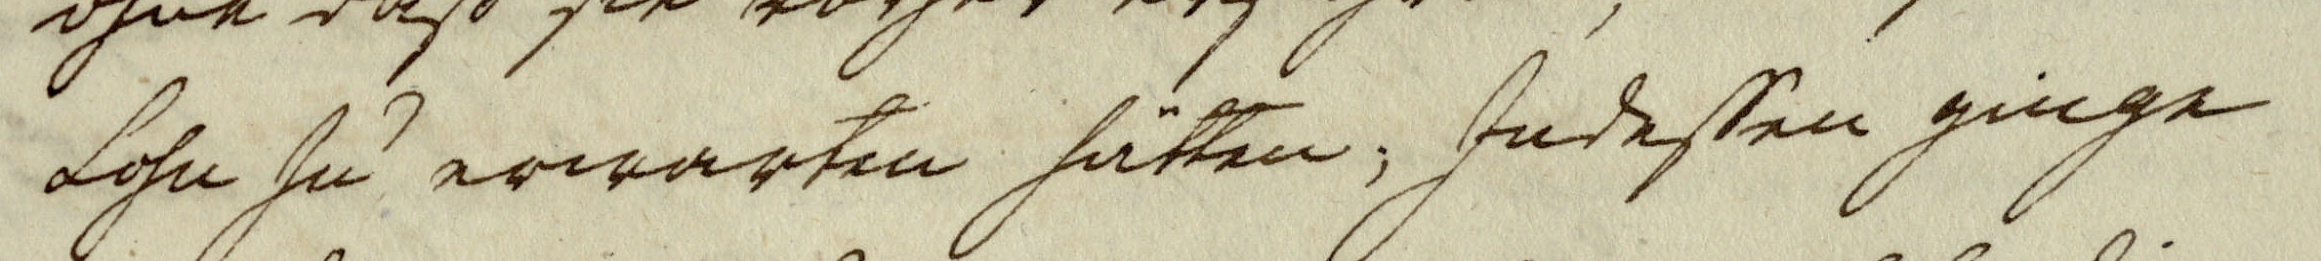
Lohn zu erwarten hätten; Indessen ginge
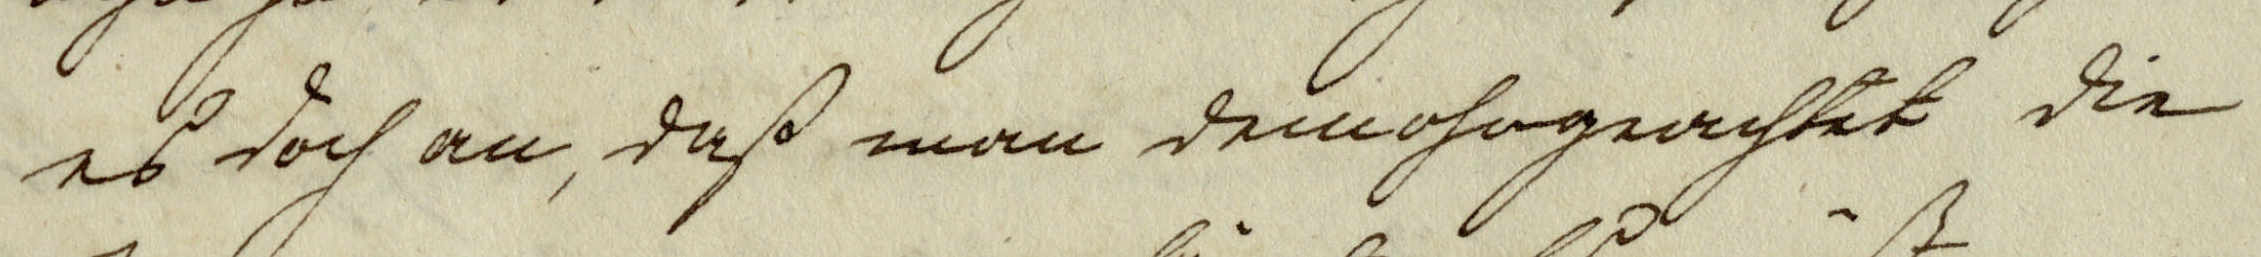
es doch an, daß man demohngeachtet die
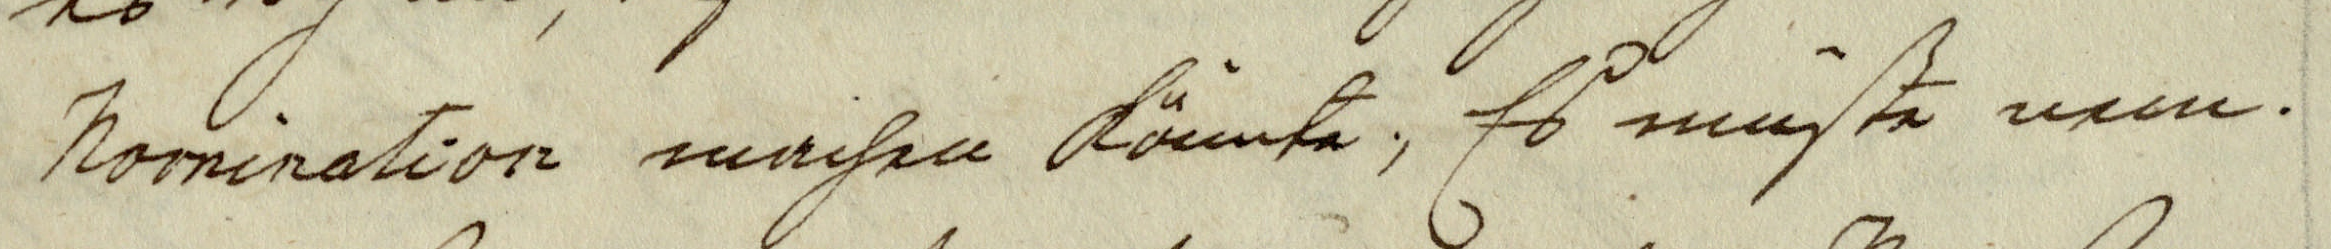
Nomination machen könnte; Es müßte nem¬
